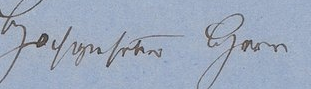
Hochgeehrter Herr
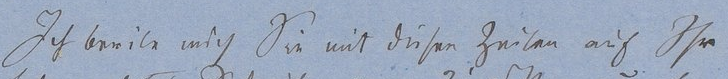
Ich beeile mich Sie mit diesen Zeilen auf Ihr
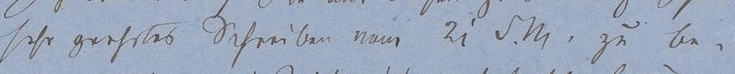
sehr geehrtes Schreiben vom 21 d. M. zu be-
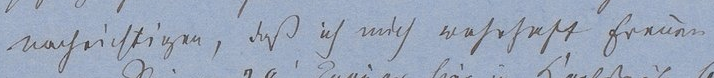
nachrichtigen, daß ich mich wahrhaft freuen
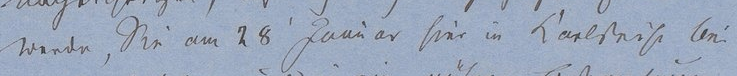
werde, Sie am 28t Januar hier in Carlsruhe bei
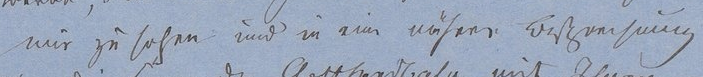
mir zu sehen und in eine nähere Besprechung
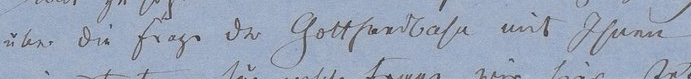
über die Frage der Gotthardbahn mit Ihnen
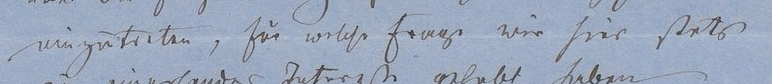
einzutreten, für welche Frage wir hier stets
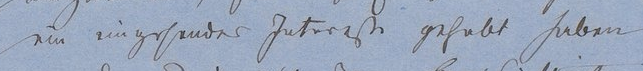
ein eingehendes Intereße gehabt haben.
